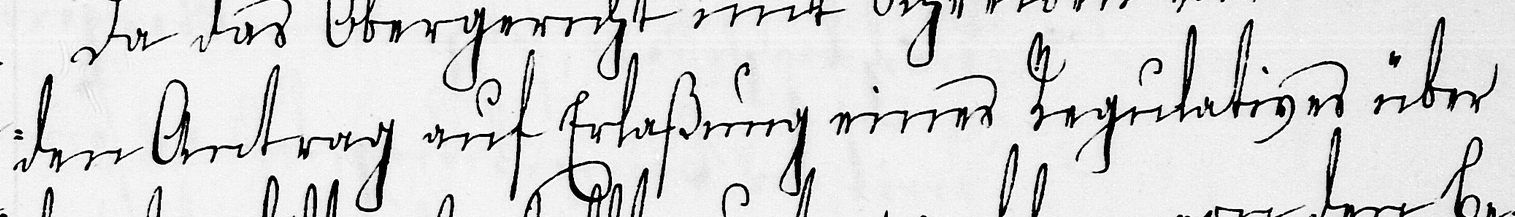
den Antrag auf Erlaßung eines Regulatives über
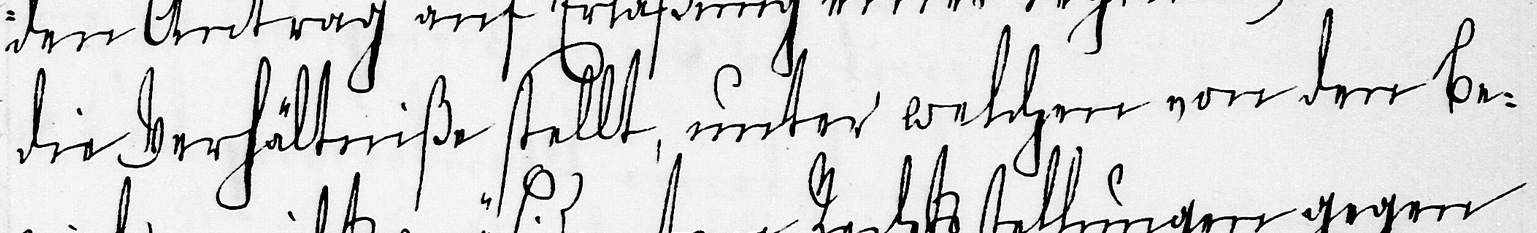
die Verhältniße stellt, unter welchen von den Bez¬
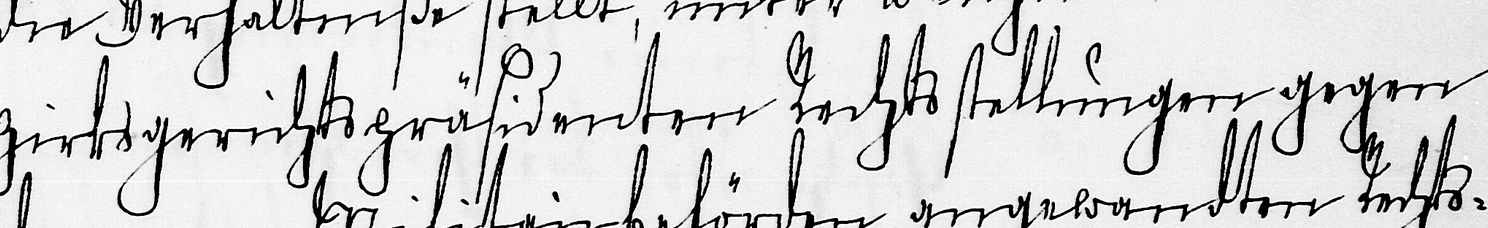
irksgerichtspräsidenten Rechtsstellungen gegen
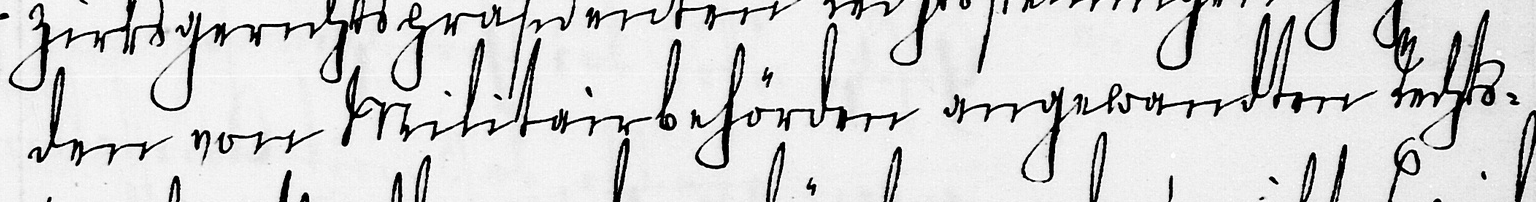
den von Militairbehörden angewandten Rechts¬
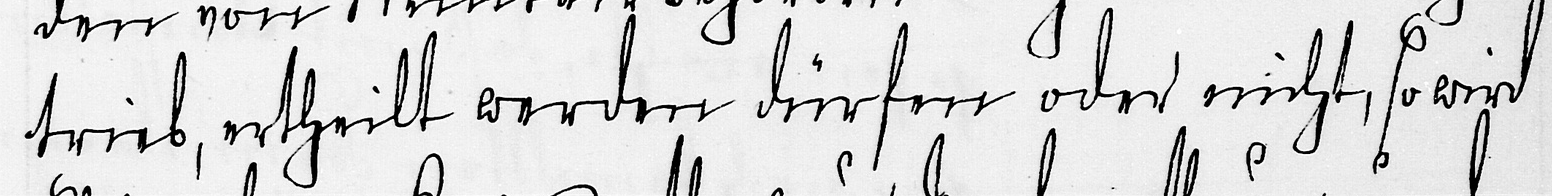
trieb, ertheilt werden dürfen oder nicht, so wird
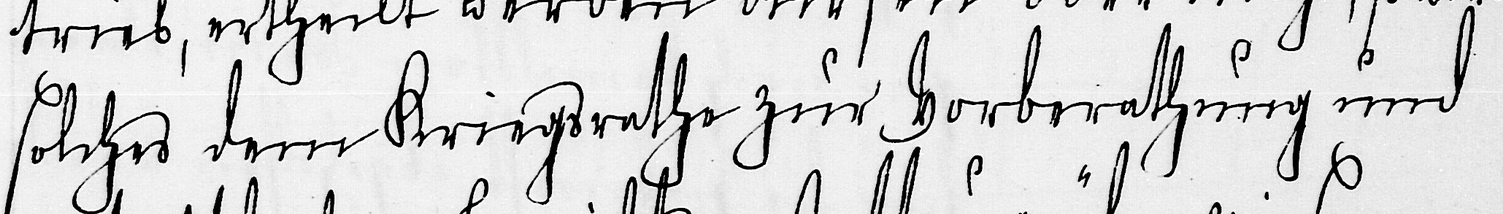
solches dem Kriegsrathe zur Vorberathung und
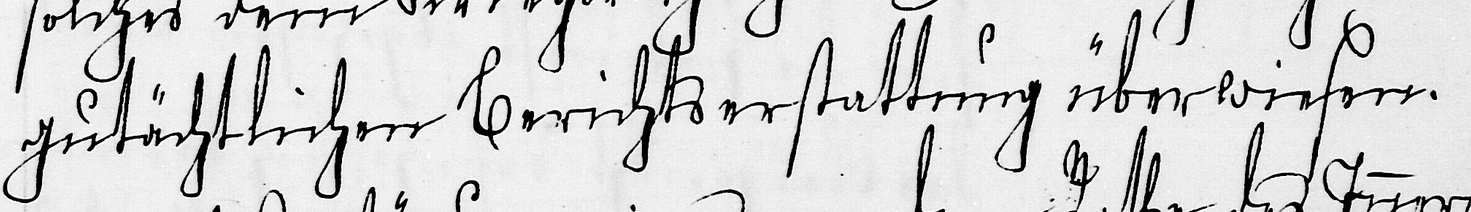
gutächtlichen Berichtserstattung überwiesen.
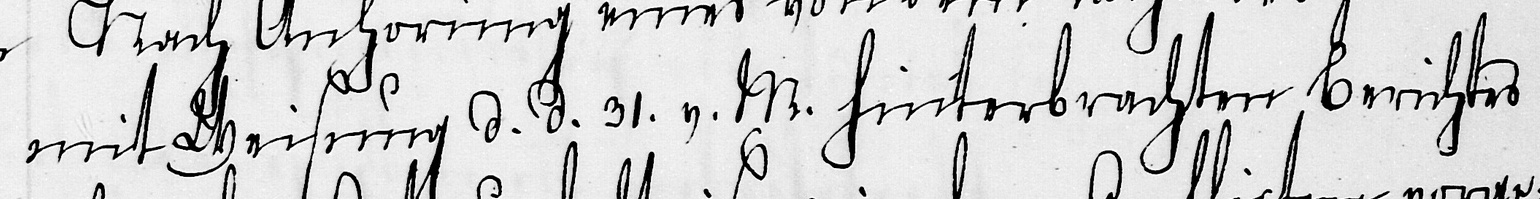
mit Weisung d. d. 31. v. M. hinterbrachten Berichtes
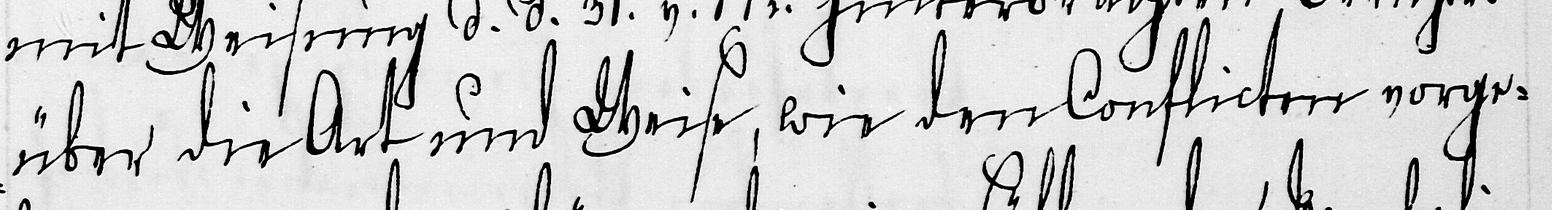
über die Art und Weise, wie den Conflicten vorge¬
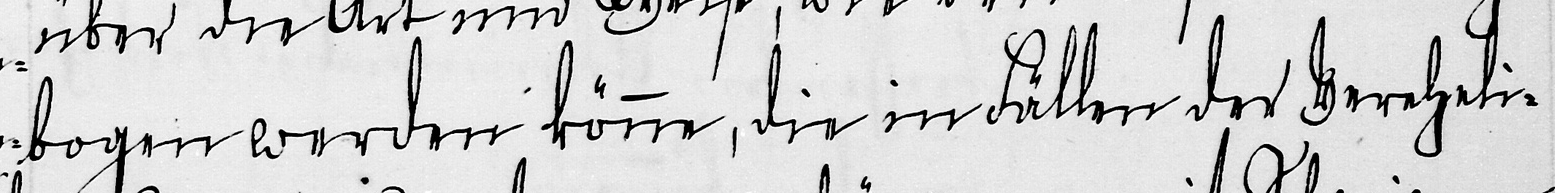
bogen werden könne, die in Fällen der Vereheli¬
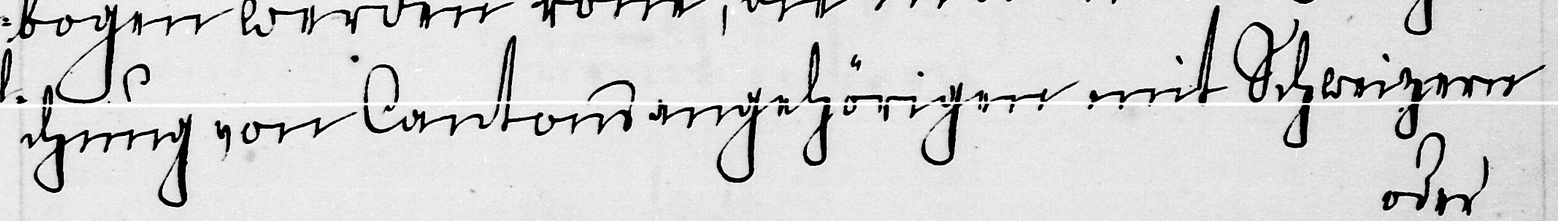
chung von Cantonsangehörigen mit Schweizern
